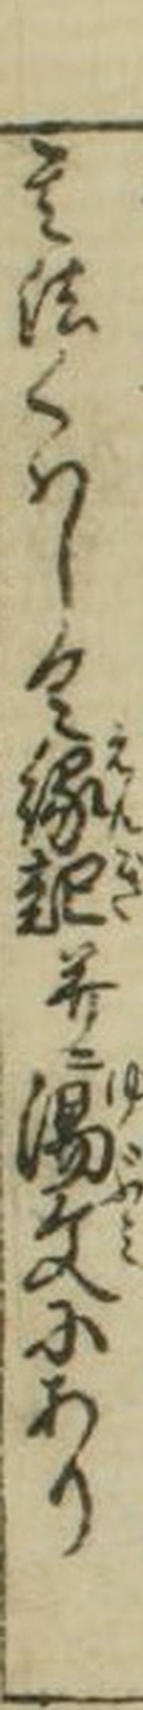其法くはしく縁起并に湯文にあり
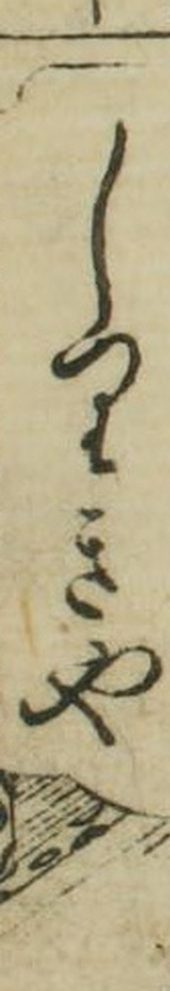しりきや

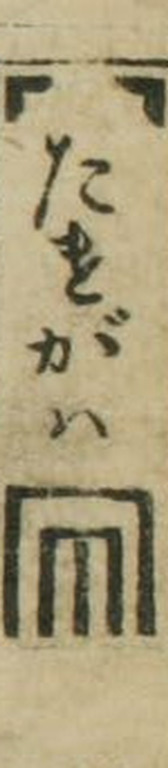たけがは
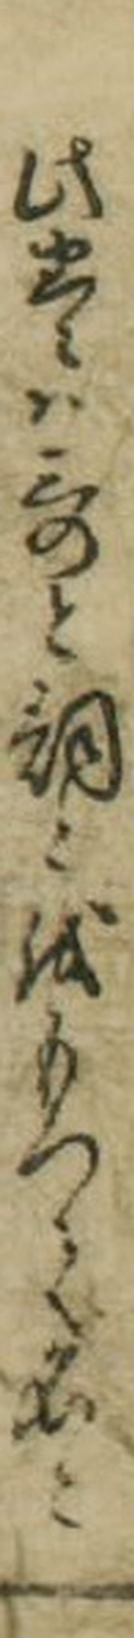此巻は哥と詞とをもつて名と
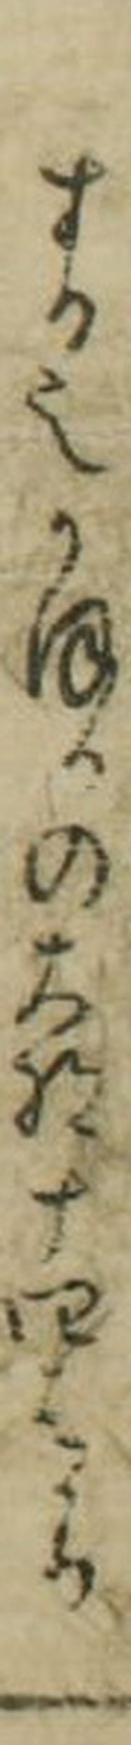する也かほるの大将十四はかり
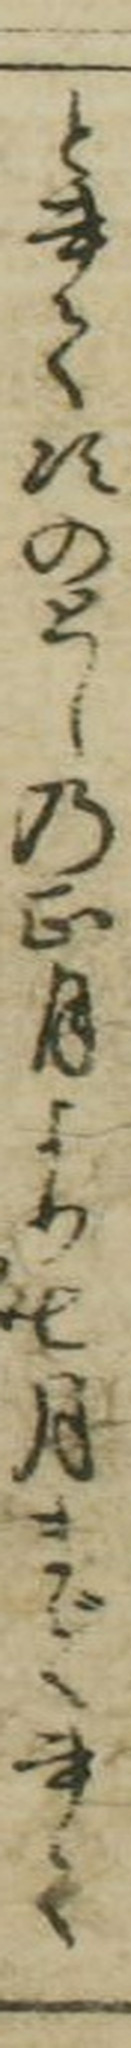と書て次のとしの正月より七月まで書て
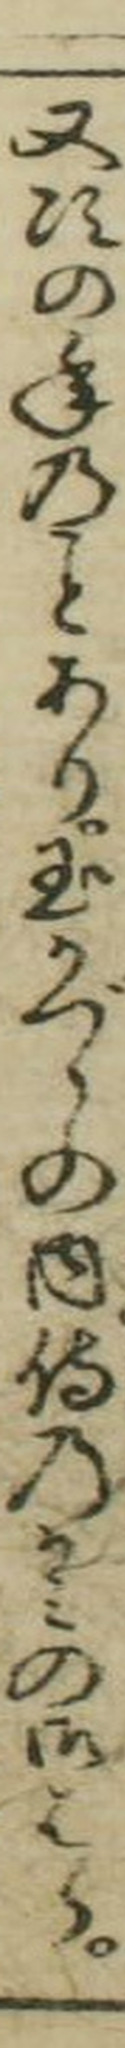又次の年のことあり。玉かづらの内侍のかみの御はら。
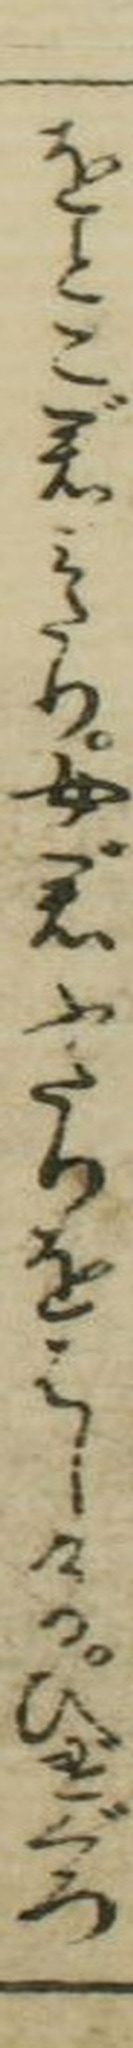をとこ”君みたり。女”君ふたりをはしける。ひげぐろ
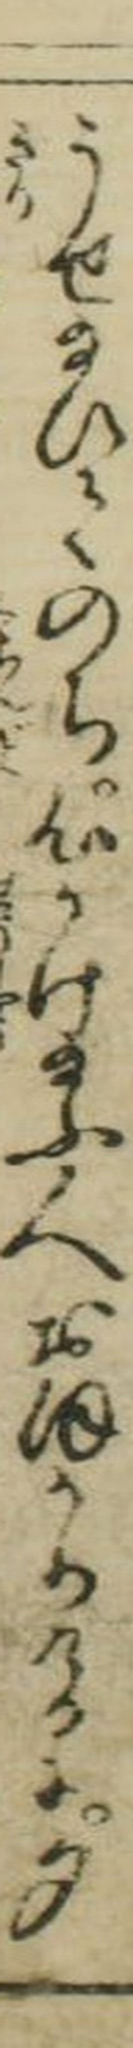うせ給ひてのち。心かけ給ふ人おほかりけるに。夕
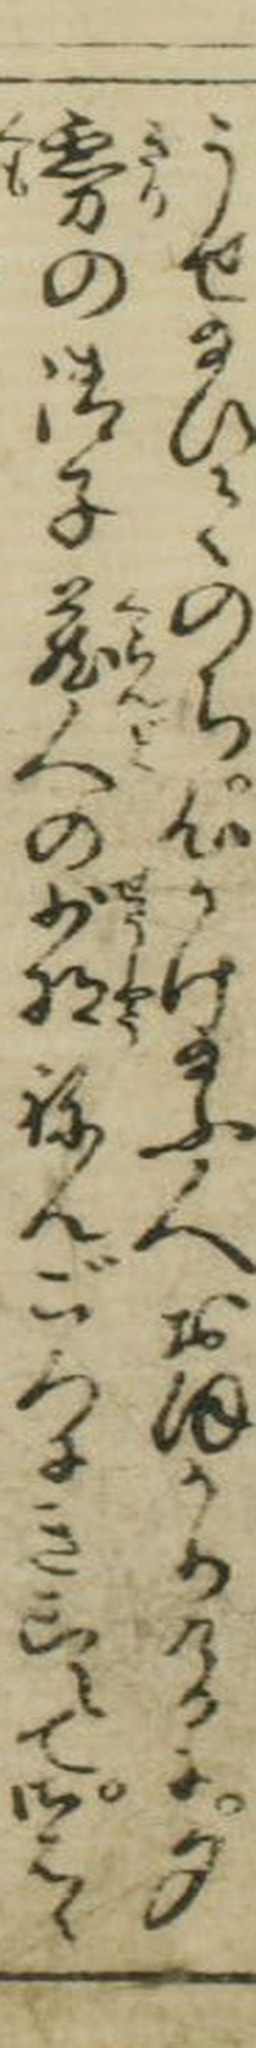霧の御子蔵人の少将ねんごろにきこえて。御はゝ
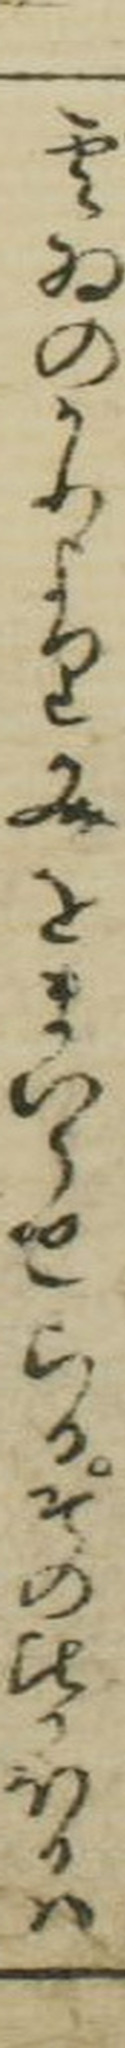雲ゐのかりより文をまいらせらる。その比かほるは
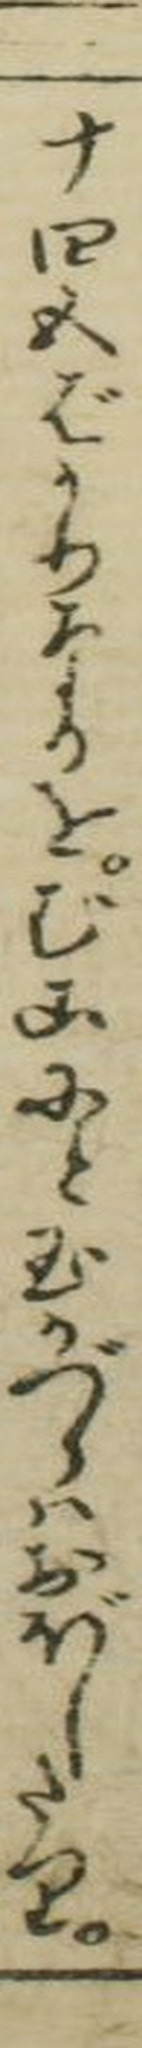十四五ばかりなるを。むこにと玉かづらはおぼしたり。
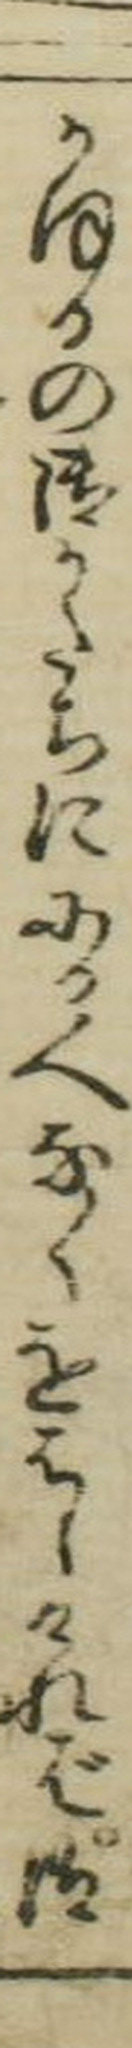かほるの御かたちににる人なくをはしければ。御
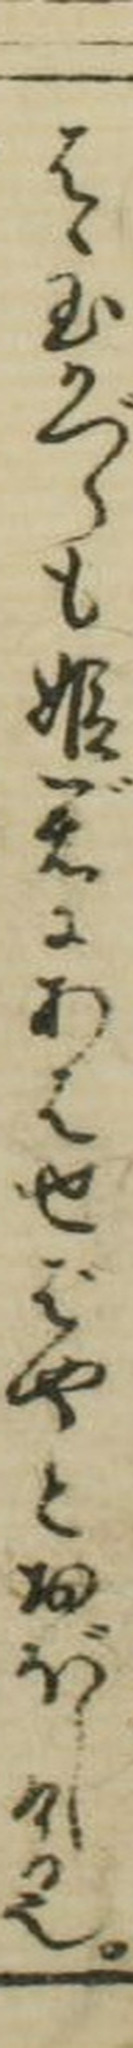はゝ玉かづらも姫”君にあはせばやとおぼしける也。
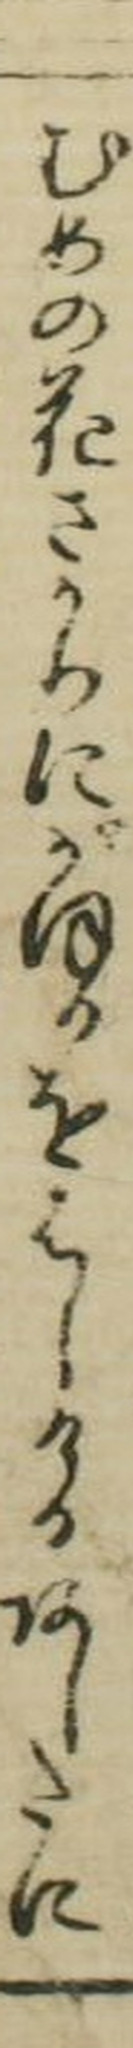むめの花さかりに。かほるをはしけるあしたに
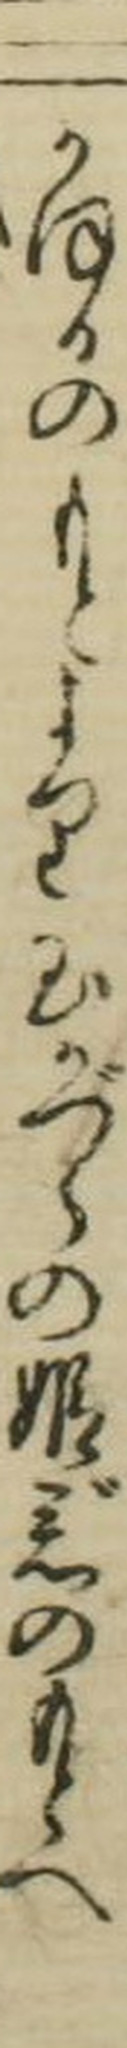かほるのもとより玉かづらの姫”君のもとへ
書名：女源氏教訓鑑
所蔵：東京学芸大学附属図書館
